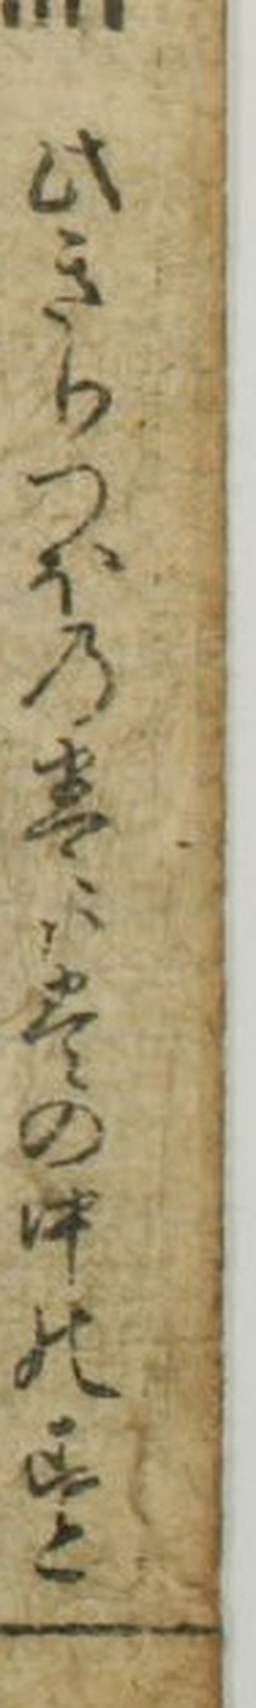此きりつほの巻は巻の中のこと
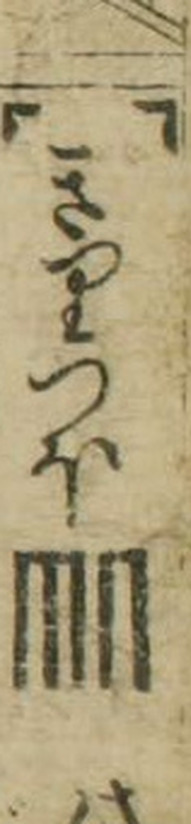きりつほ
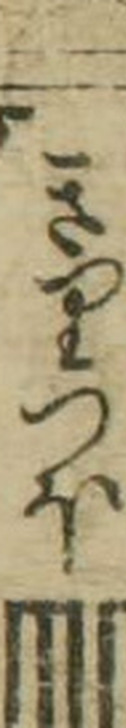きりつほ
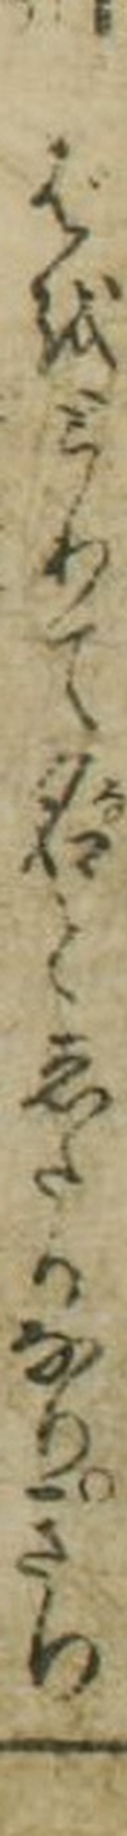ばをとりて名としたるなり。きり
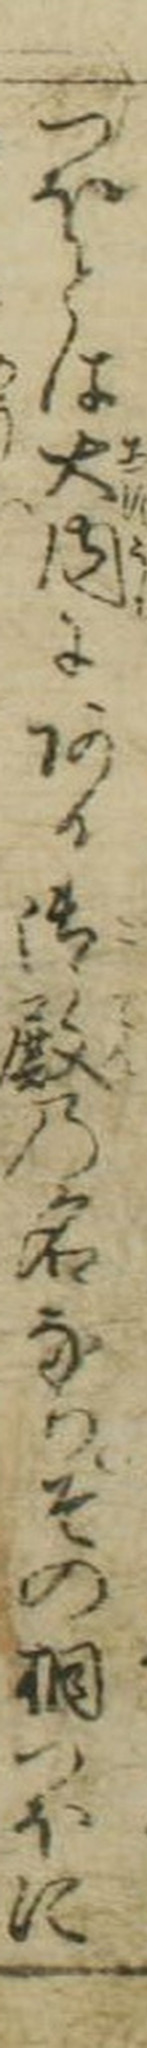つほとは大内にある御殿の名なり。その桐つほに
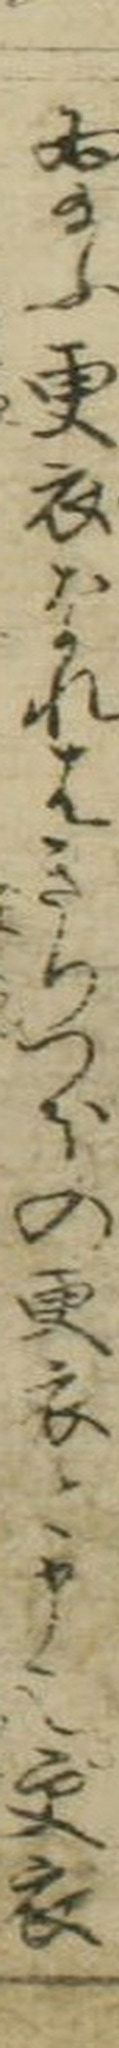ゐ給ふ更衣なれはきりつほの更衣と申也。更衣
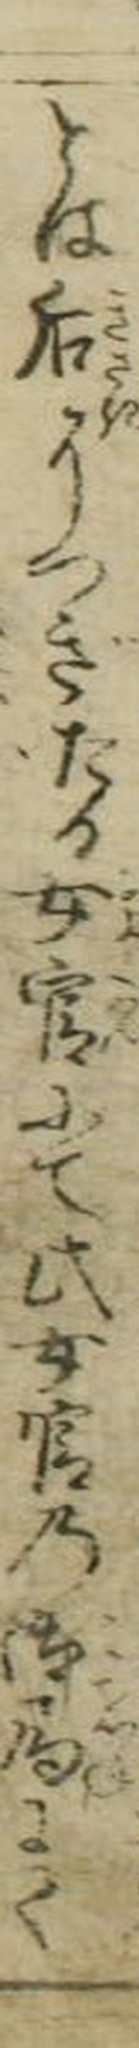とは后につぎたる女官にて此女官の御局にて
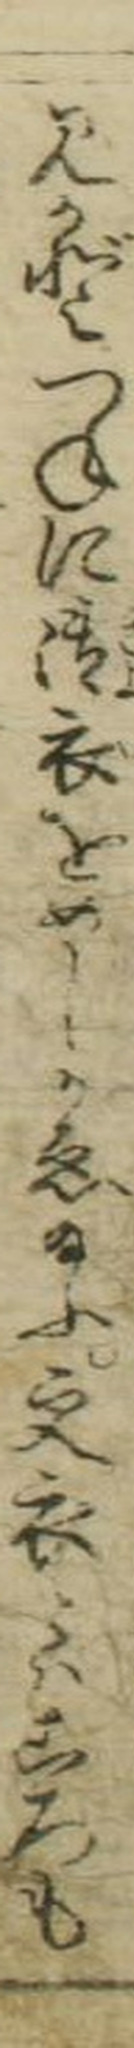みかどつねに御衣をめしかゑ給ふ。更衣とはころも
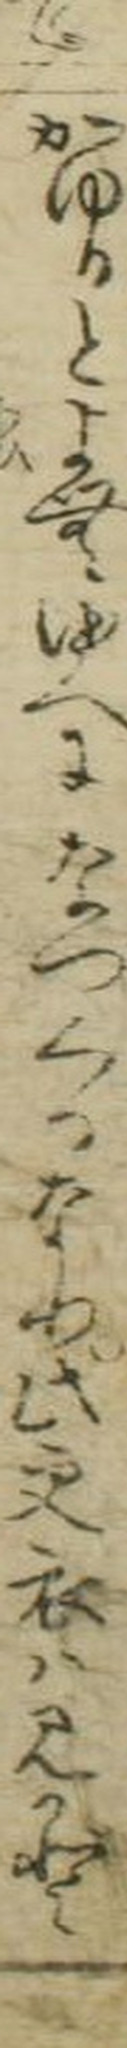かゆるとよむゆへになつくるなり。此更衣はみかど
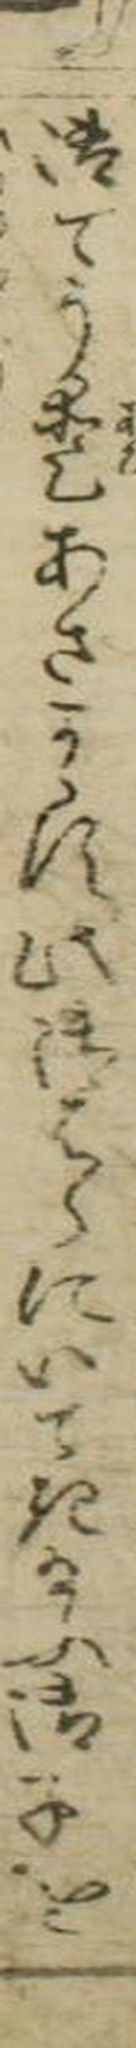御てう愛あさからす此御はらにいてき給ふ御子を
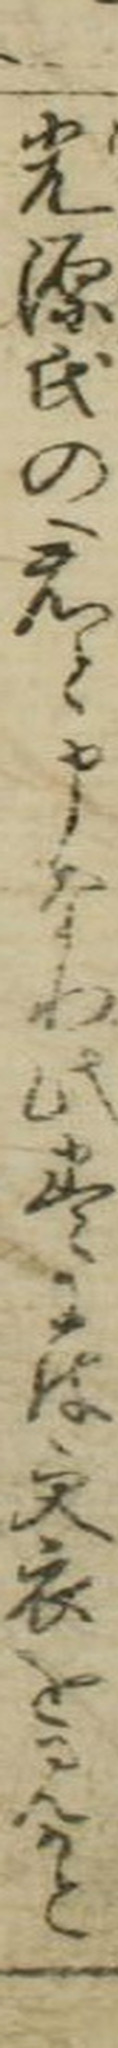光源氏の君と申なり此巻には更衣をみかと
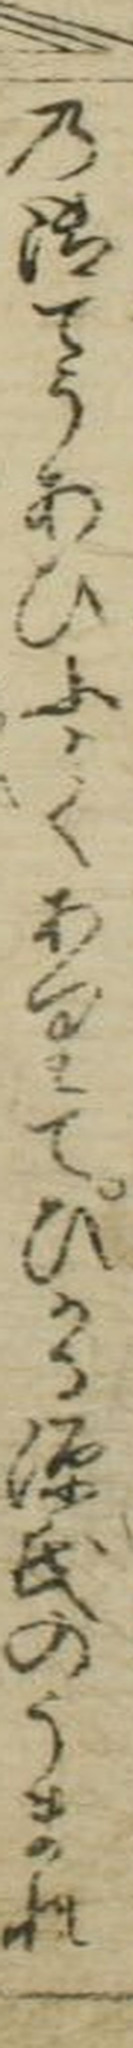の御てうあひふかくありて。ひかる源氏のうまれ
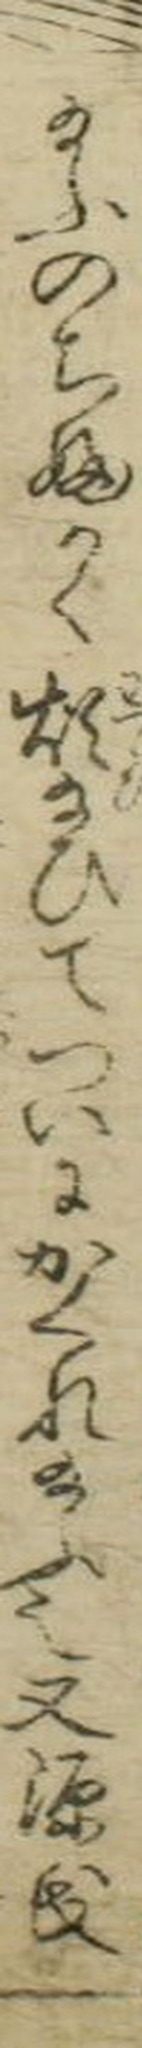給ふのちふかく煩給ひてついにかくれ給ふ也又源氏
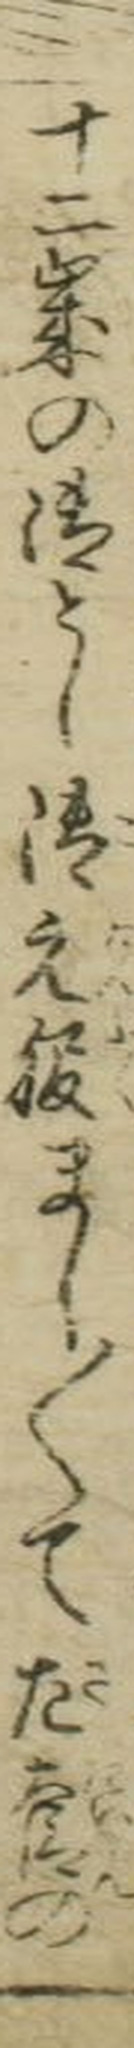十二歳の御とし御元服まし〳〵て左大臣の
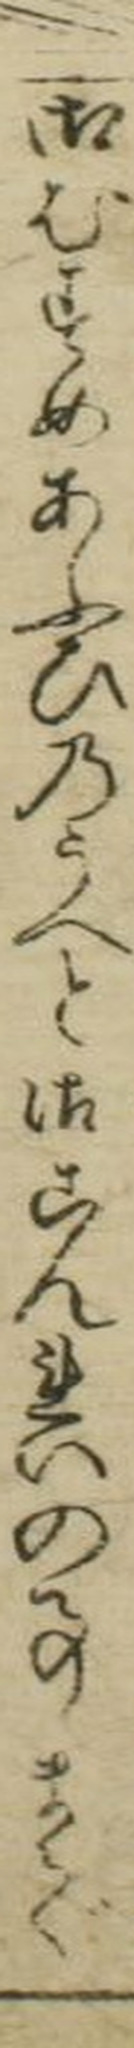御むすめあふひのうへと御こんれいの事まで
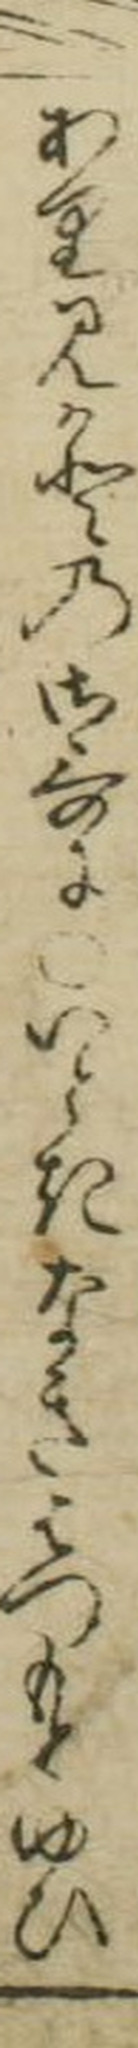ありみかとの御哥に○いときなきはつもともとゆひ
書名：女源氏教訓鑑
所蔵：東京学芸大学附属図書館
